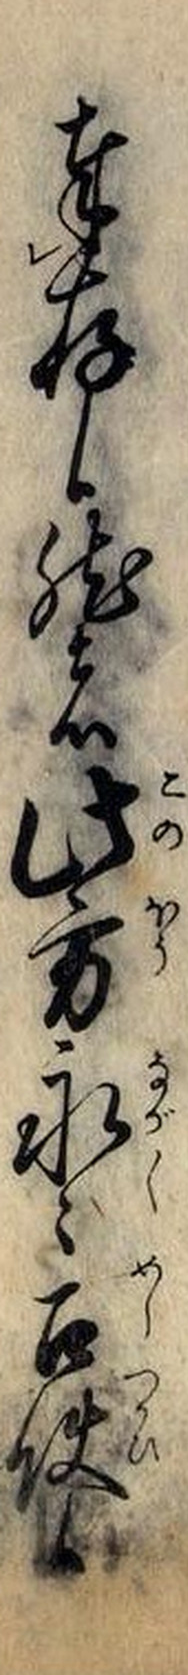奉存候然者此方永々召使候
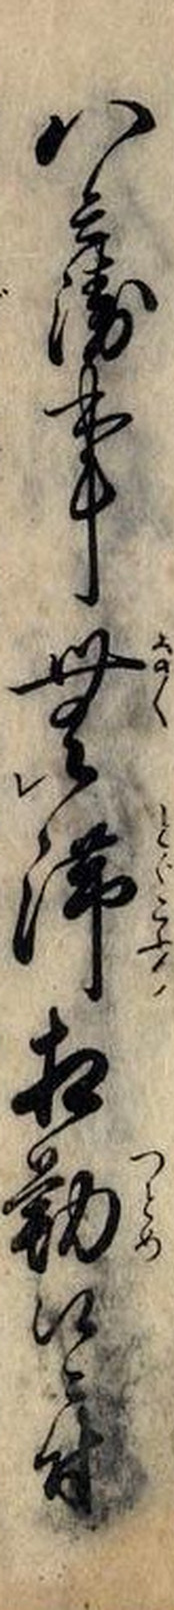八兵衛事無滞相勤候に付
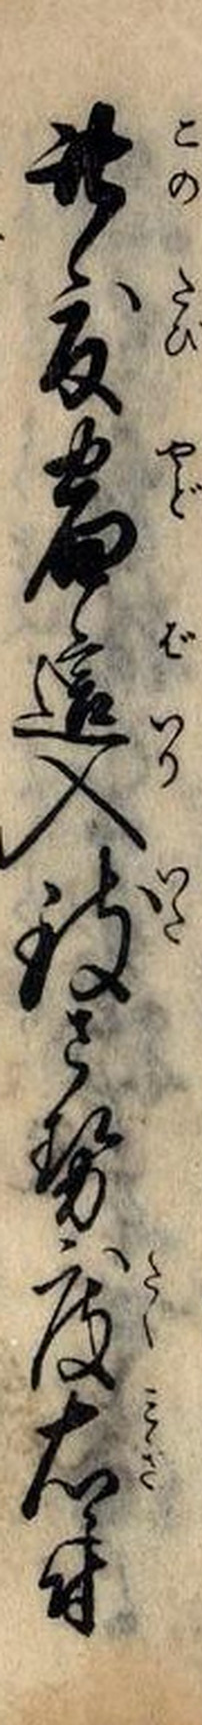此度宿這入致させ度右に付
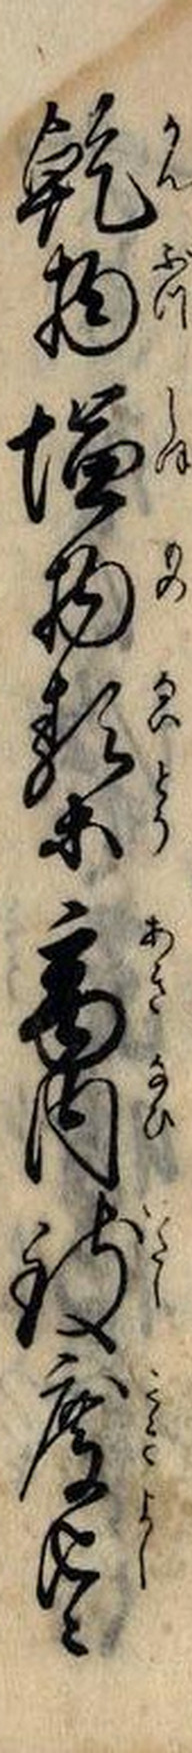乾物塩物類等商内致度由に
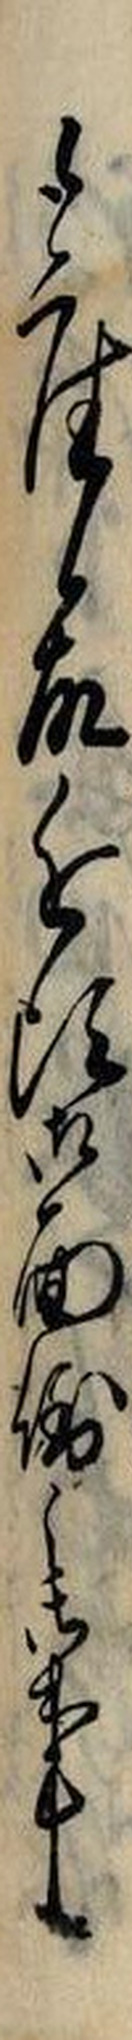御座候故近頃御面倒之御事も
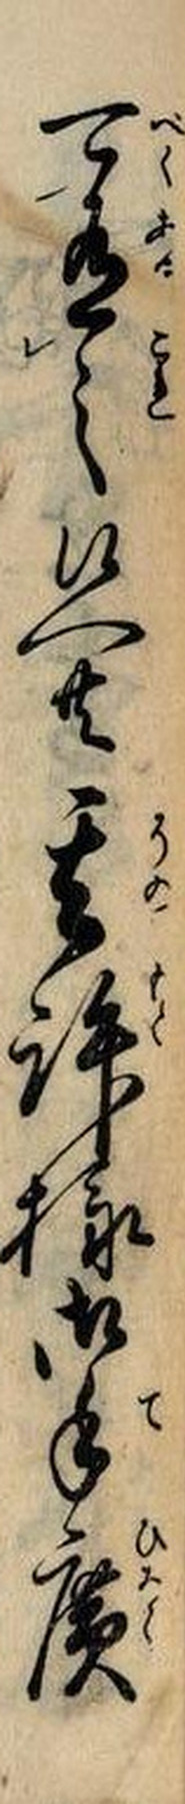可有之候ヘ共其許様御手廣
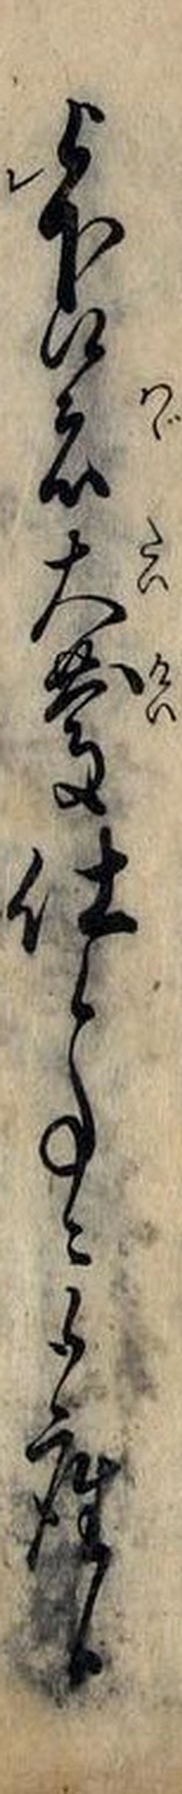被下候者大慶仕候事に御座候
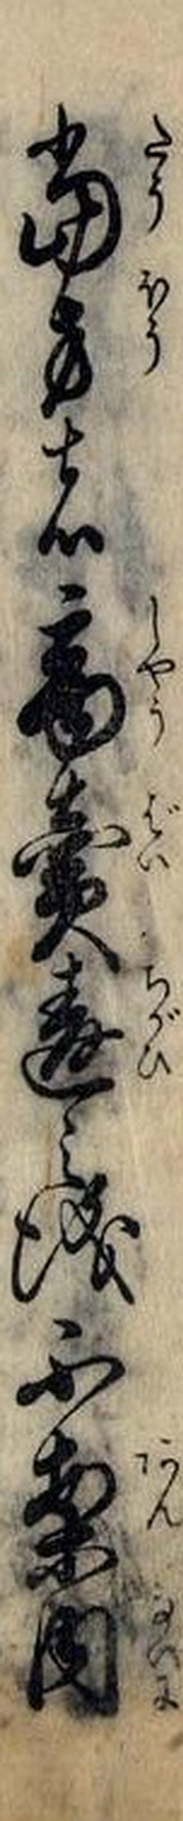當方者商賣違之儀不案内
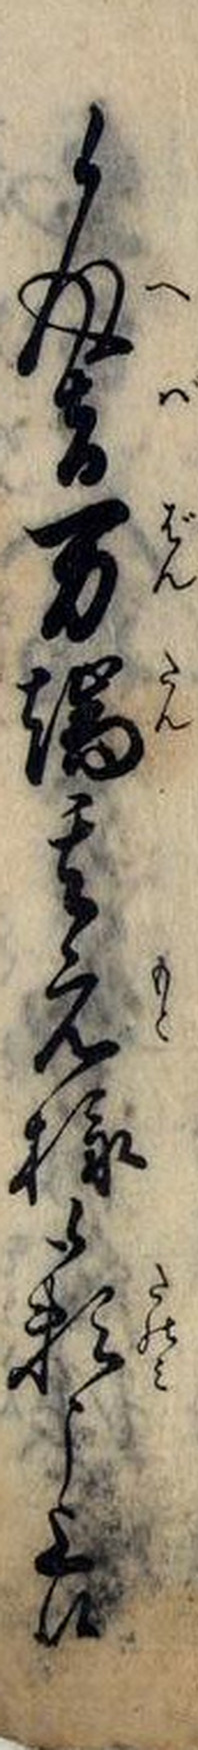候得者万端其元様御頼申上候

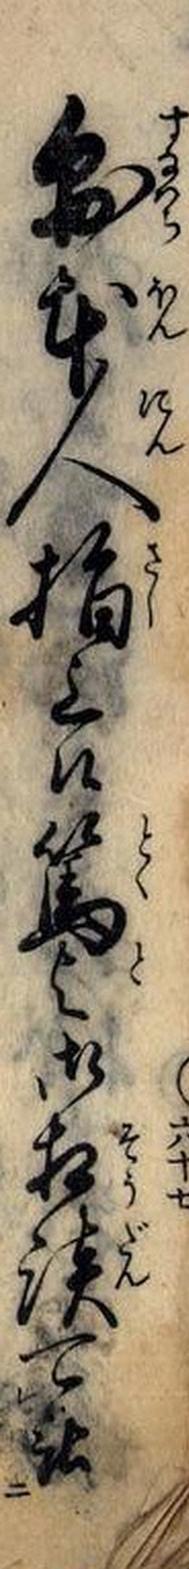則本人指上候篤与御相談可被
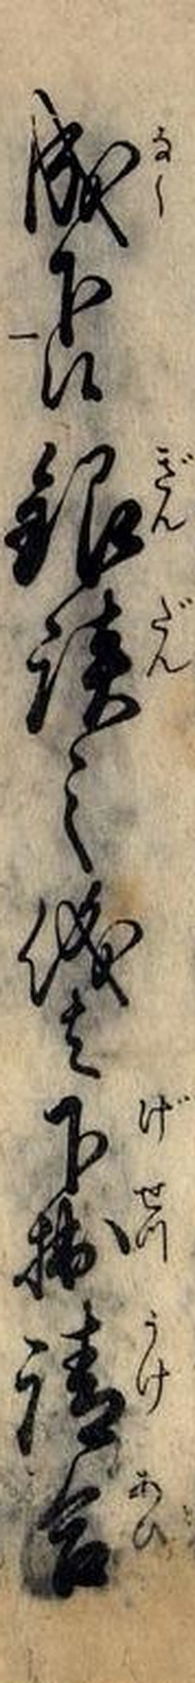成下候銀談之儀者下拙請合
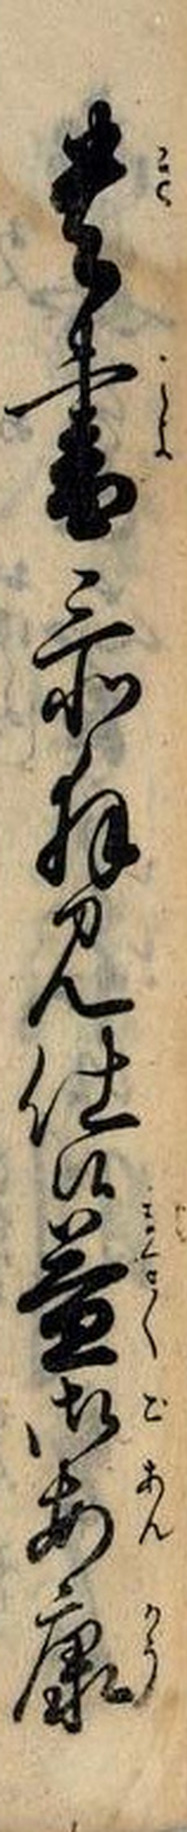貴書忝拝見仕候益御安康
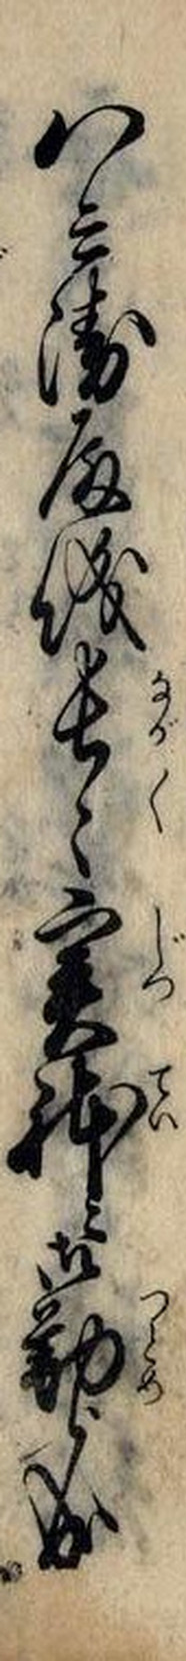八兵衛殿儀長々実躰に御勤被成
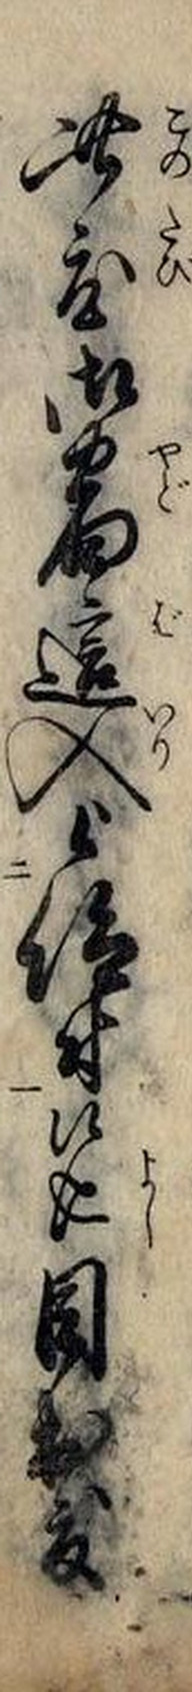此度御宿這入被仰付候由目出度
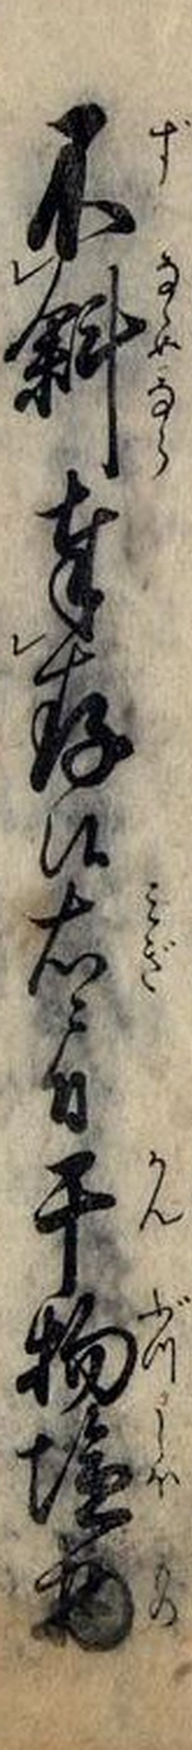不斜奉存候右に付干物塩物
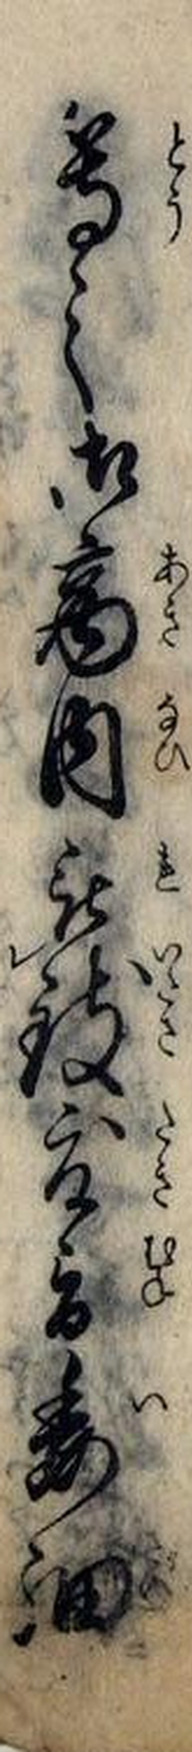等之御商内被致度旨委細
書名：大成用文章（往来物）
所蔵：福井県文書館 Fukui Prefectural Archives
